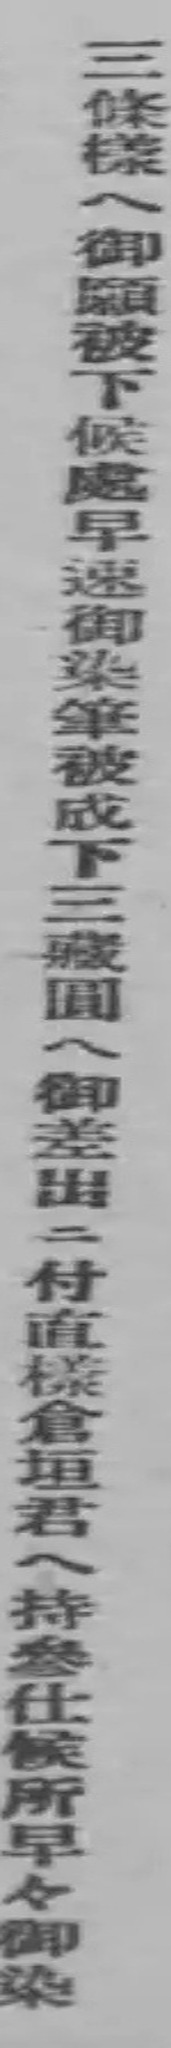三條様へ御願被下候処早速御染筆被下三蔵円へ御差出ニ付直様倉垣君へ持参仕候所早々御染
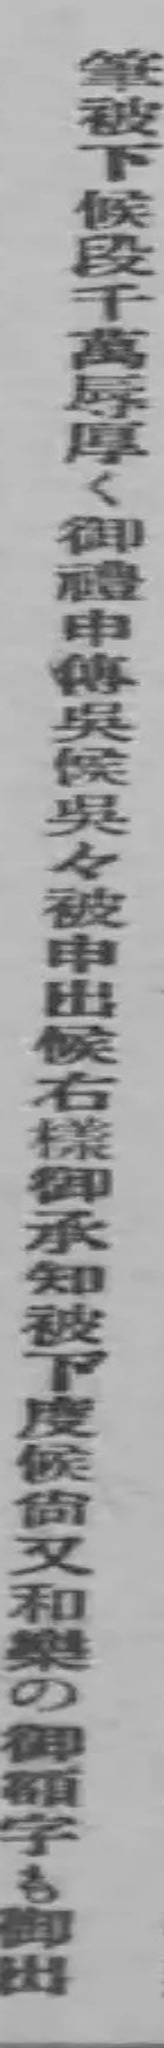筆被下候段千萬辱厚く御礼申伝呉候呉々被申出候右様御承知被下度候尚又和楽の御額字も御出
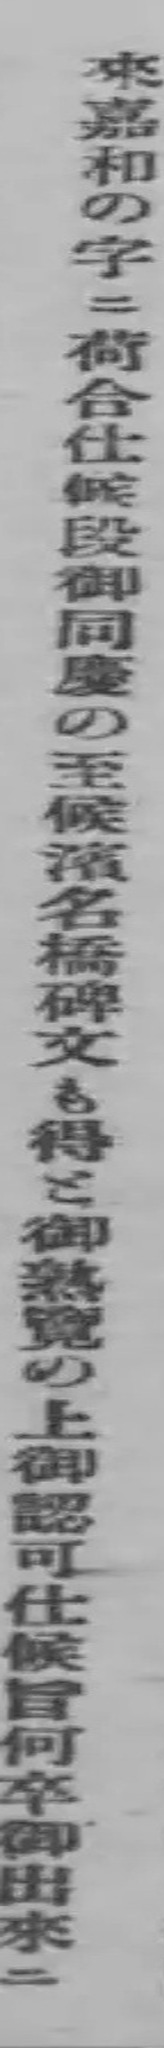来嘉和の字ニ荷合仕候段御同慶の至候浜名橋碑文も得と御熟覧の上御認可仕候旨何卒御出来ニ
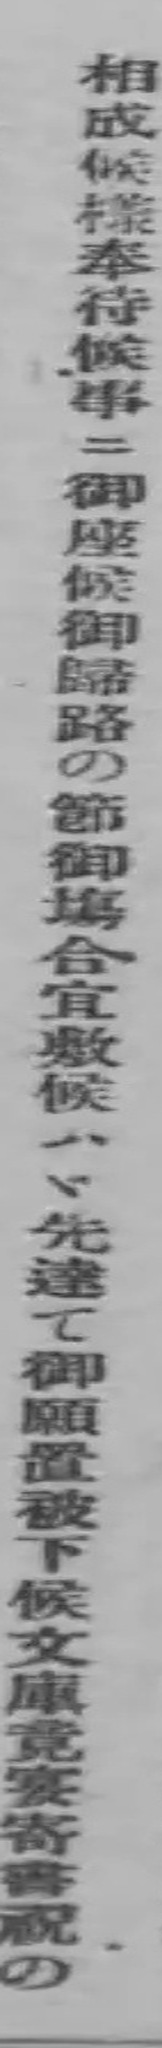相成候様奉待候事ニ御座候御帰路の節御場合宜敷候はゞ先達て御願置被下候文庫竟宴寄書祝の
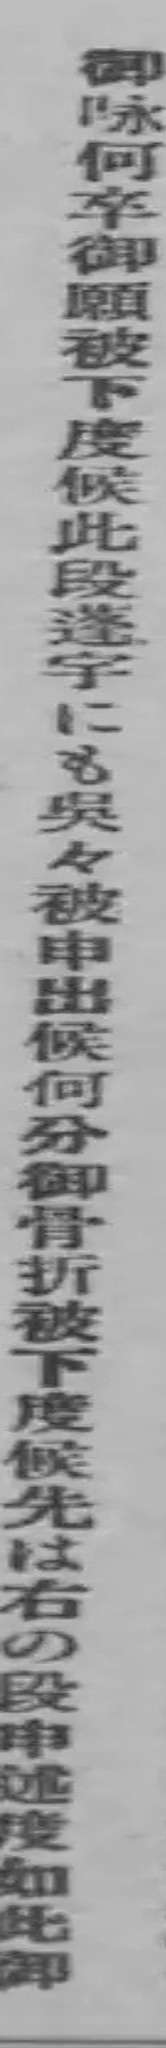御昹何卒御願被下度候此段蓬宇にも呉々被申出候何分御骨折被下度候先は右の段申述度如此御
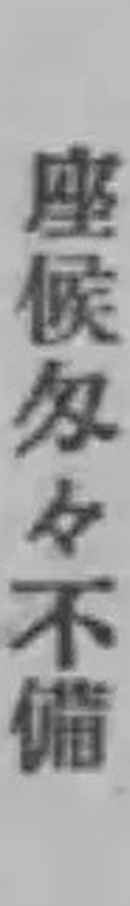座候匁々不備
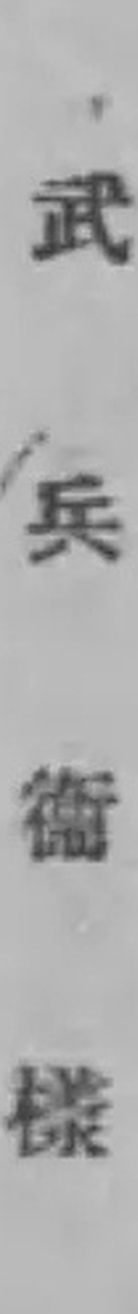武兵衛様
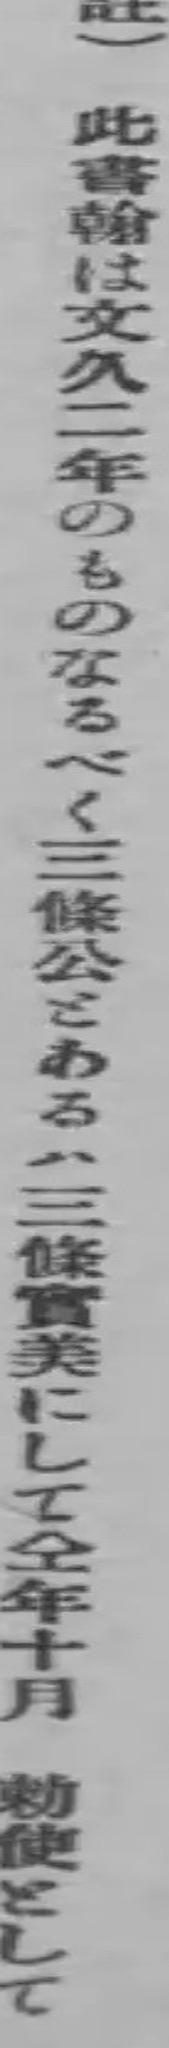(註)此書翰は文久二年のものなるべく三條公とあるは三條実美にして仝年十月勅使として
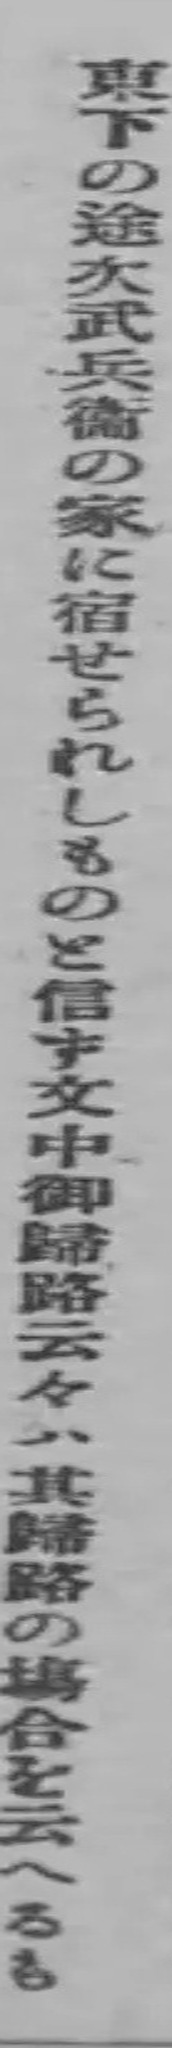東下の途次武兵衛の家に宿せられしものと信ず文中御帰路云々は其帰路の場合を云へるも
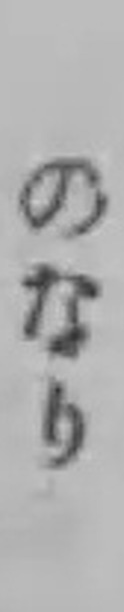のなり
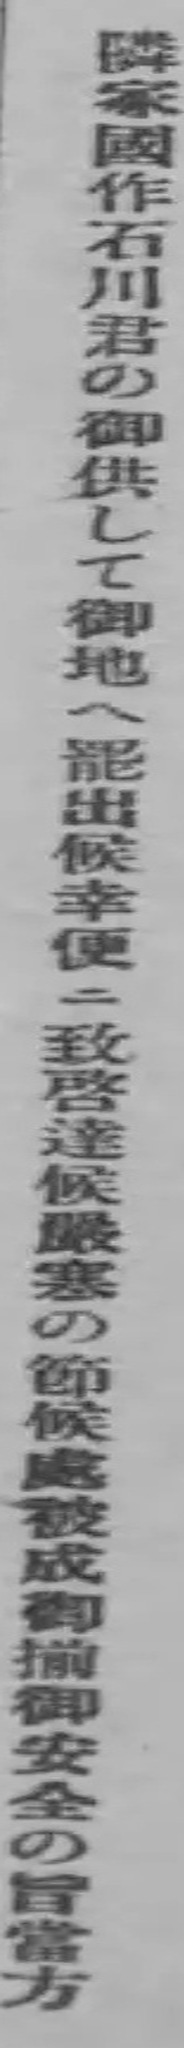隣家国作石川君の御供して御地へ罷出候幸便ニ致啓達候厳寒の節候処被成御揃御安全の旨当方
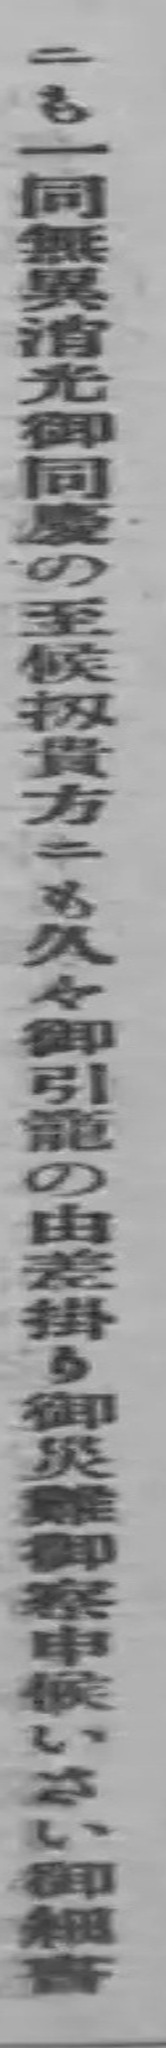ニも一同無異消光御同慶の至候扨貴方ニも久々御引籠の由差掛り御災難御察申候いさい御細書
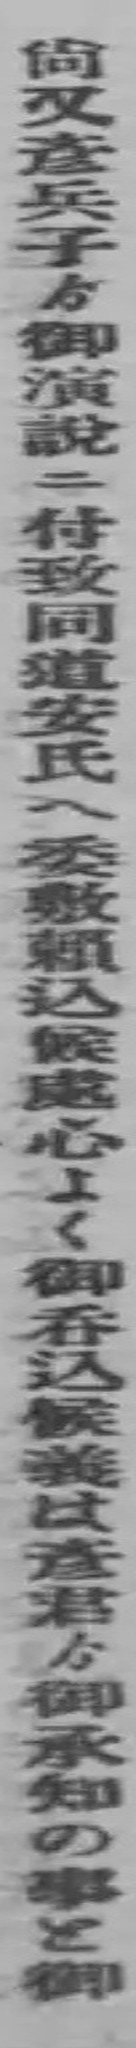尚又彦兵子ゟ御演説ニ付致同道安氏へ委敷頼込候処心よく御呑込候義は彦君ゟ御承知の事と御
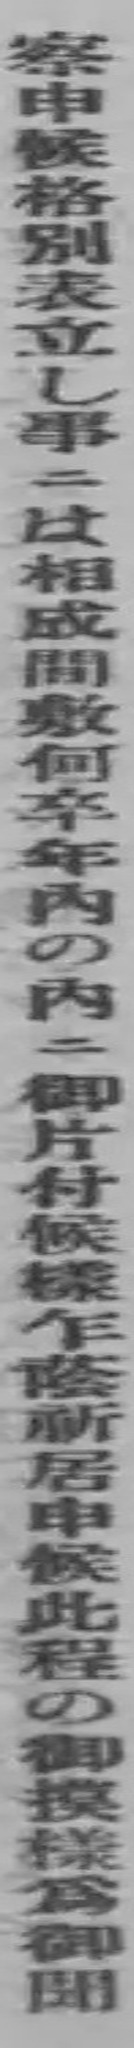察申候格別表立し事ニは相成間敷何卒年内の内ニ御片付候様乍蔭祈居申候此程の御模様為御聞
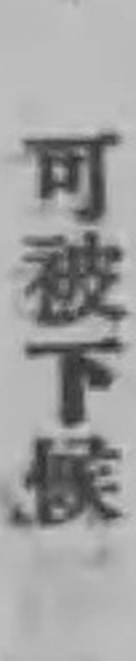可被下候
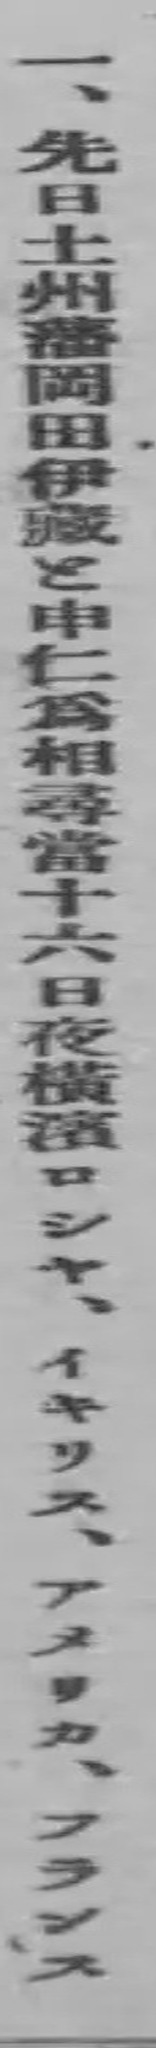一、先日土州藩岡田伊蔵と申仁為相尋当十六日夜横浜ロシヤ、イキリス、アメリカ、フランス
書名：豊橋市史談
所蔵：国立国会図書館 National Diet Library, JAPAN
